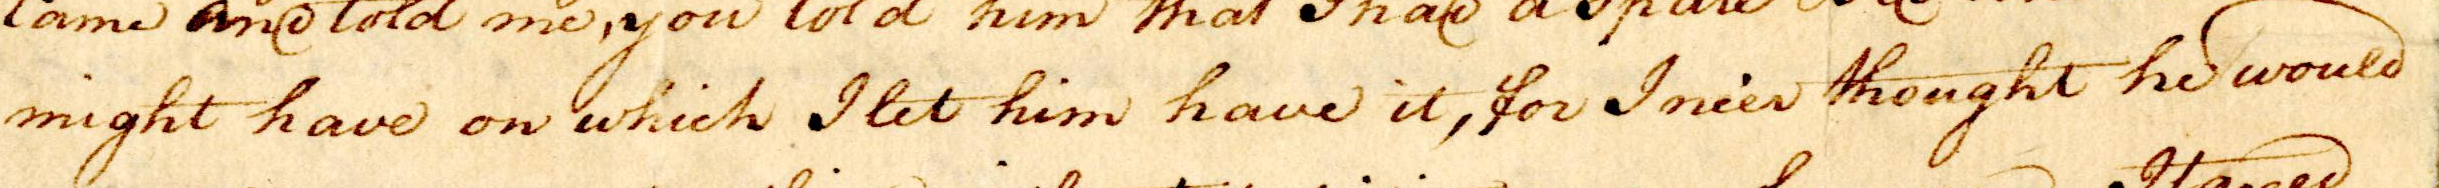might have on which I let him have it, for I ne'er thought he would
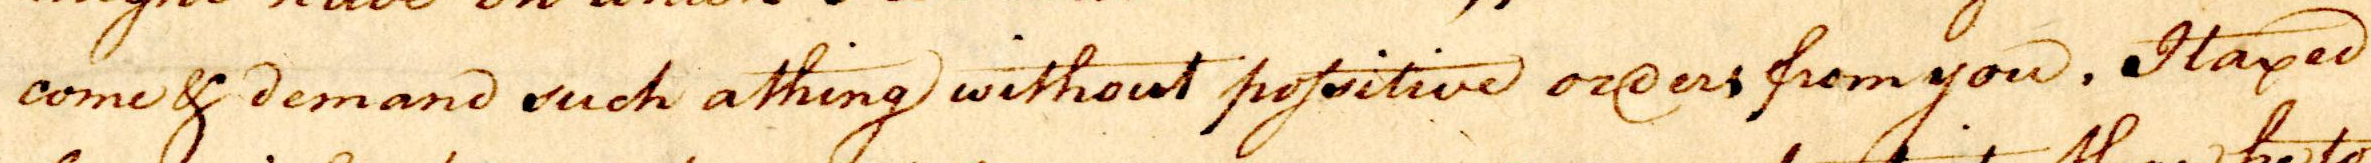come & demand such a thing without positive orders from you, Stayed
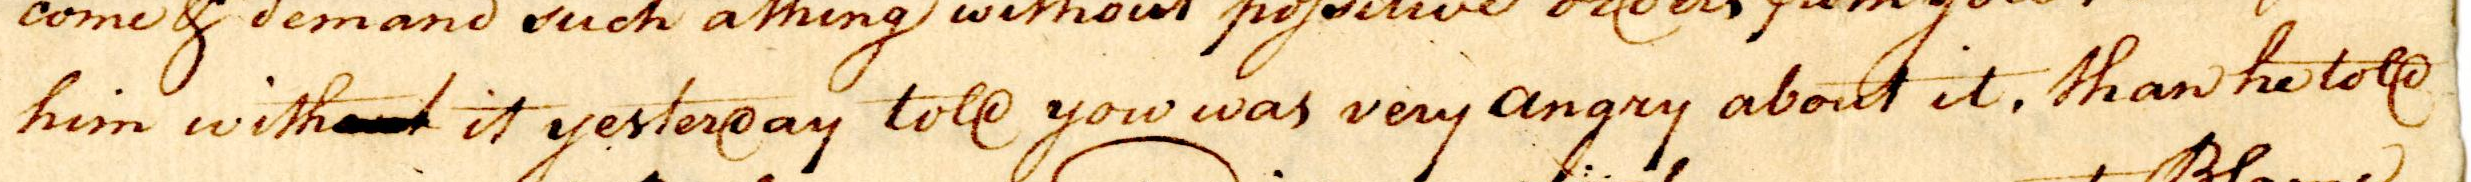him with[_]t it yesterday told you was very angry about it, than he told
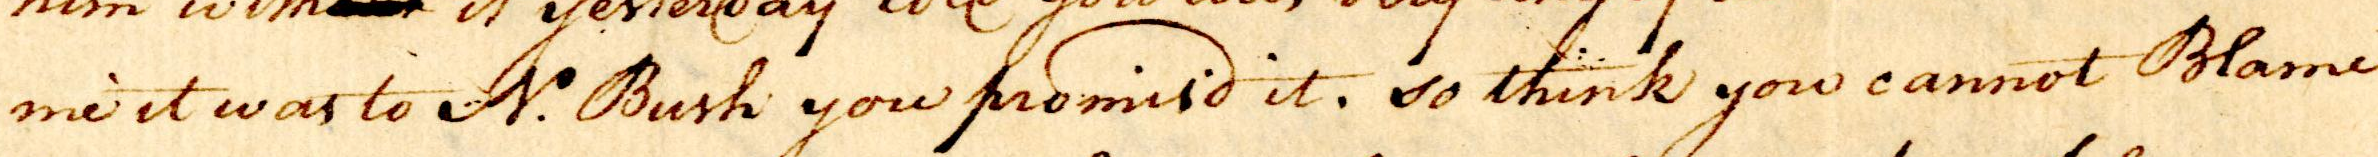me it was to N^r. Bush you promis'd it. so think you cannot Blame
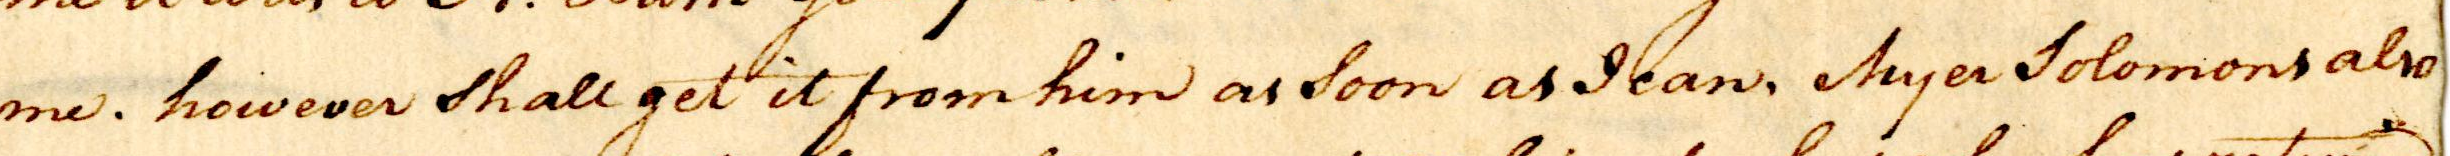me. however shall get it from him as Soon as I can, Myer Solomons also
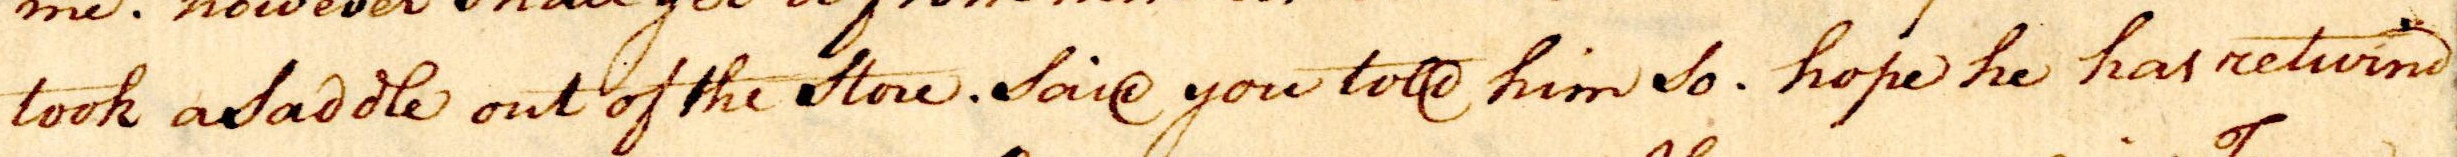took a Saddle out of the Store. Said you told him so. hope he has returnd
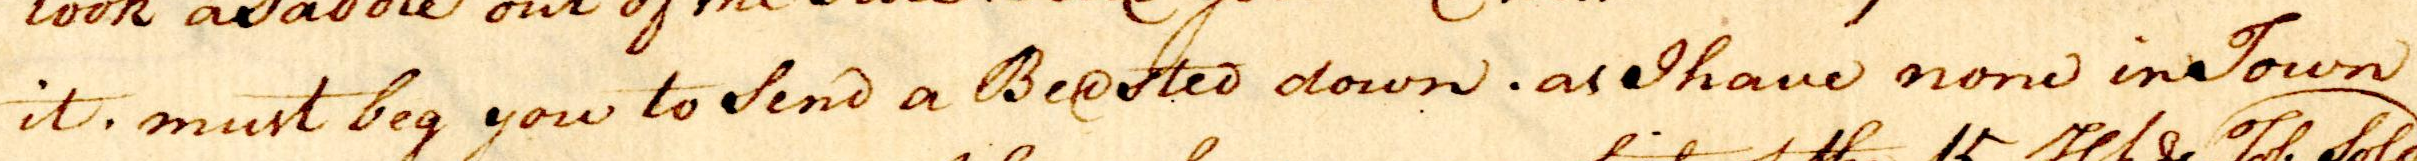it, must beg you to Send a Bedsted down as I have none in Town
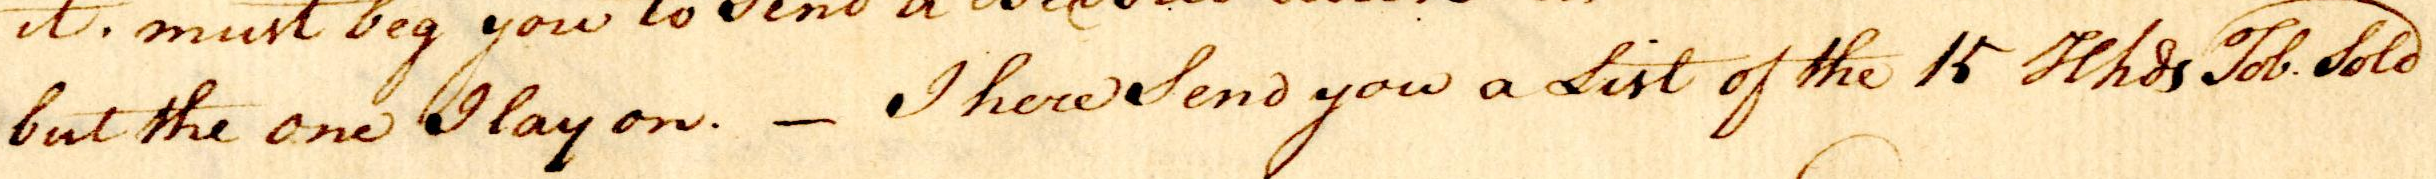but the one I lay on.- I here Send you a List of the 15 Hhds Tob. sold
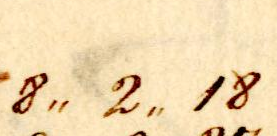8..2..18
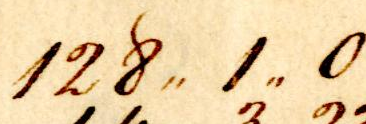128..1..0
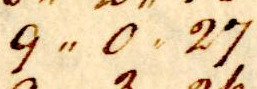9..0..27
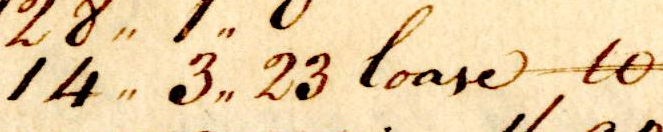14..3.. 23 loase to
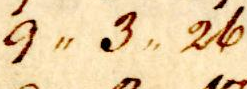9..3..26
